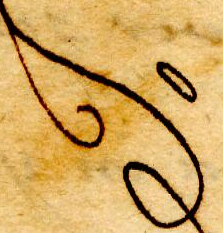To
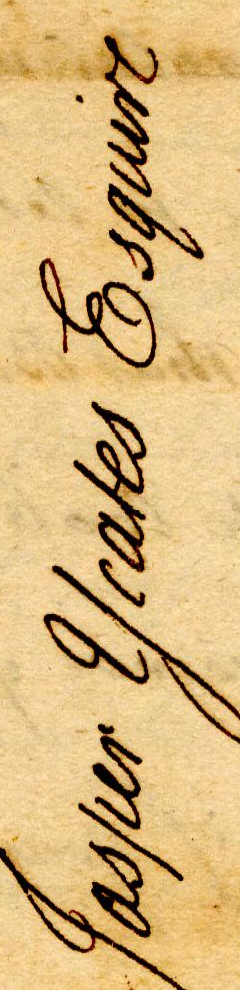Jasper Yeates Esquire
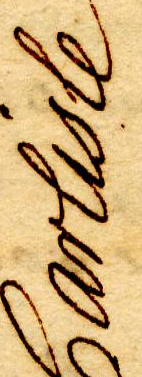Carlisle
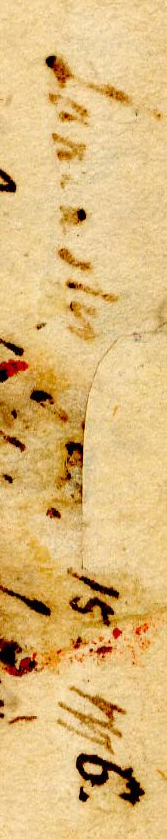Lancaster Jul. 15^th 1776.
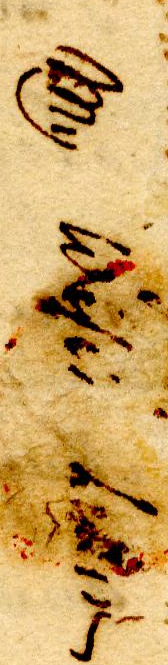My Wife's Letter
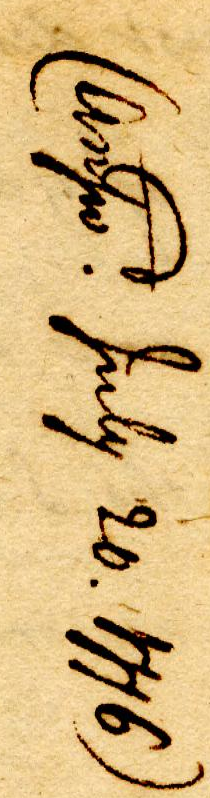(Answ^d. July 20. 1776)
